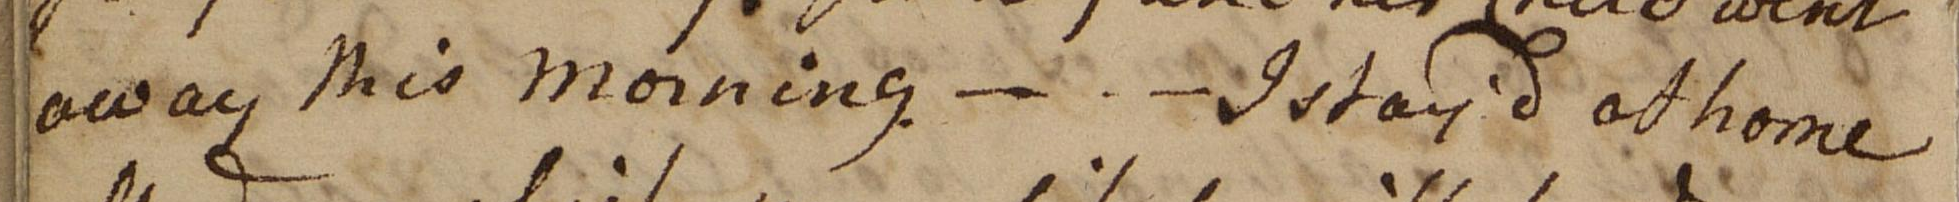away this morning-.- I stay'd at home
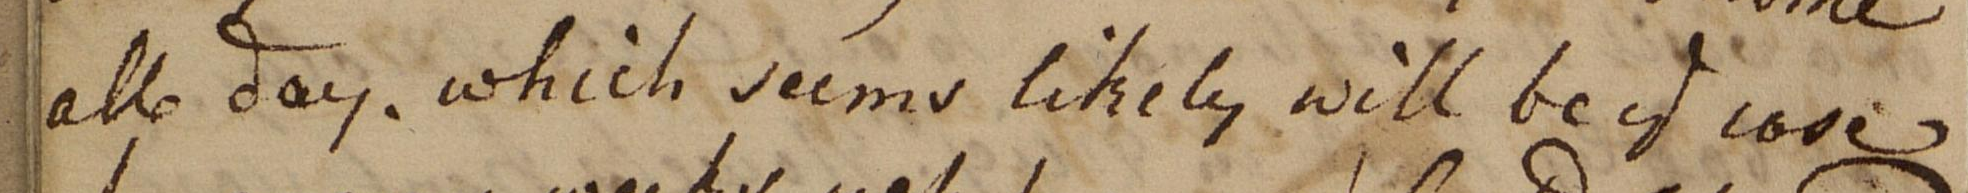all day. which seems likely will be y^e case
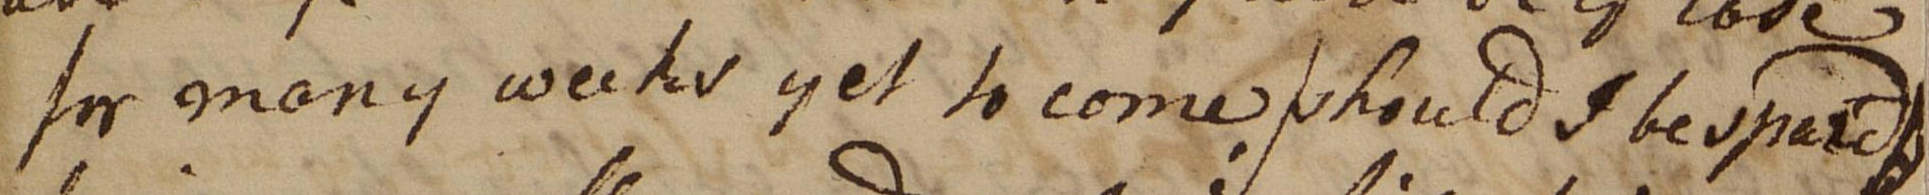for many weeks yet to come /should I be spar'd/
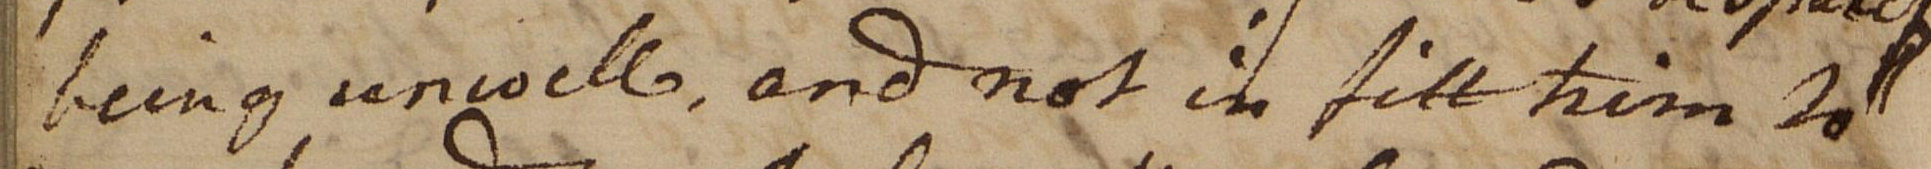being unwell, and not in fitt trim to
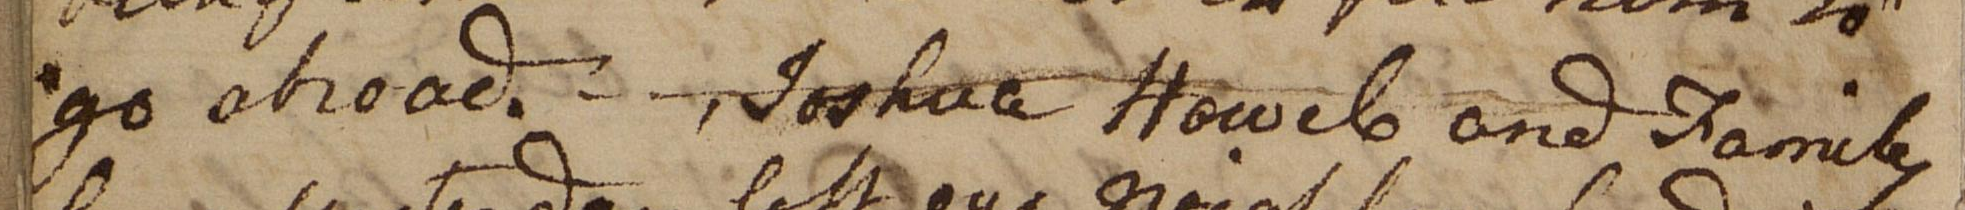go abroad.- Joshua Howel and Family
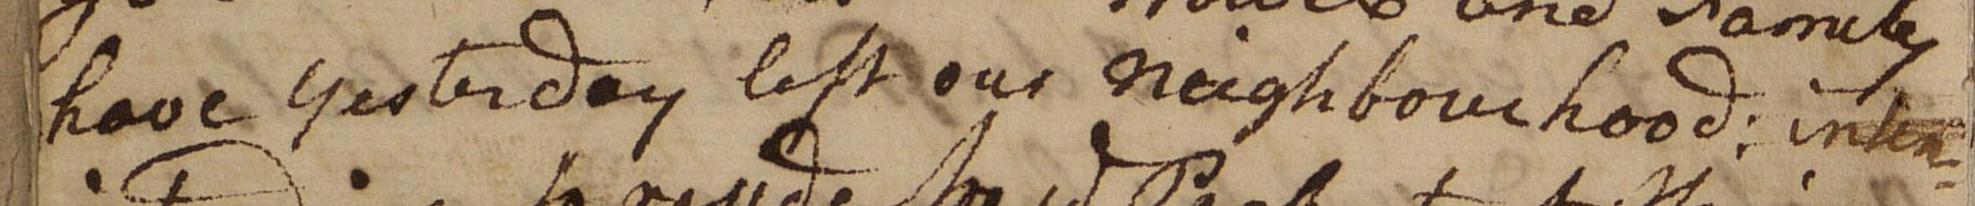have yesterday left our neighbourhood: into
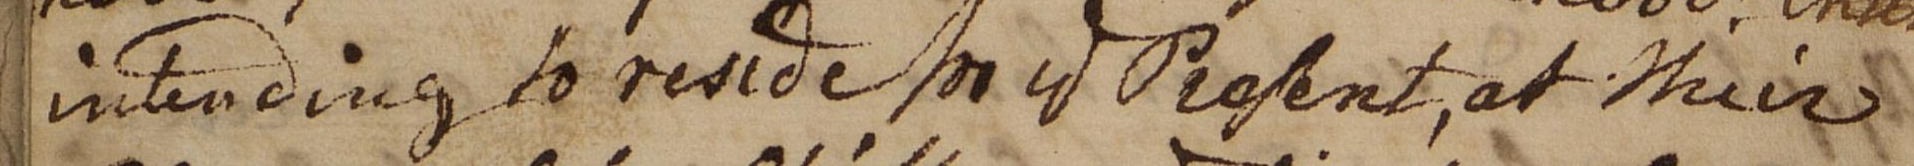intending to reside for y^e Present, at their
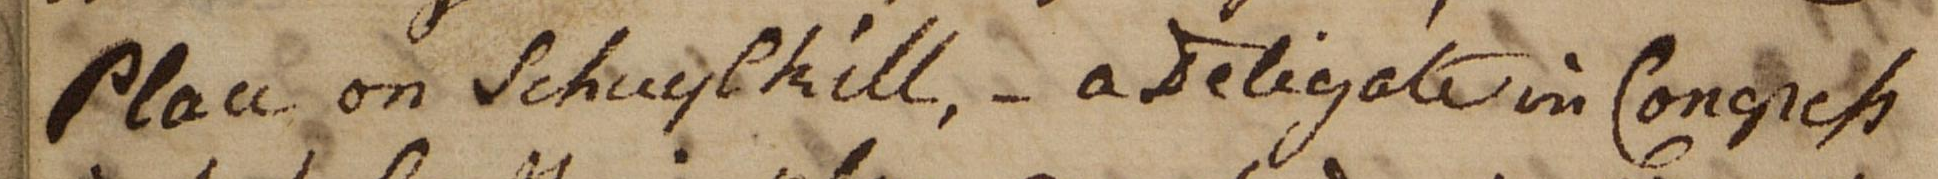Place on Schuylkill,- a Delegate in Congress
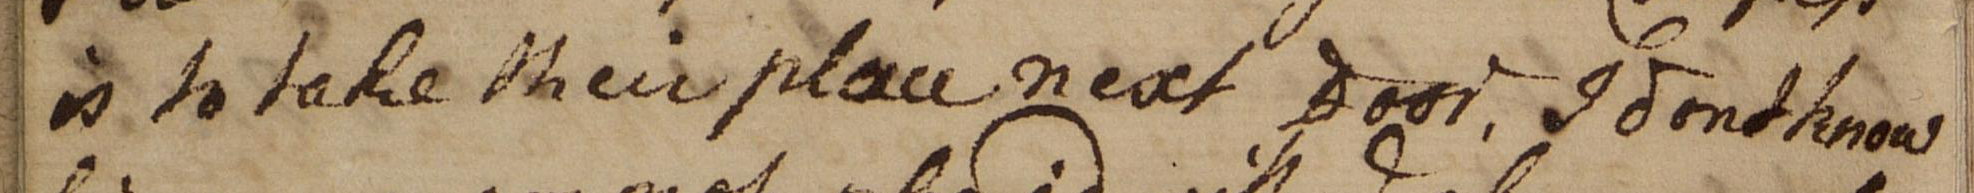is to take their place next Door, I dont know
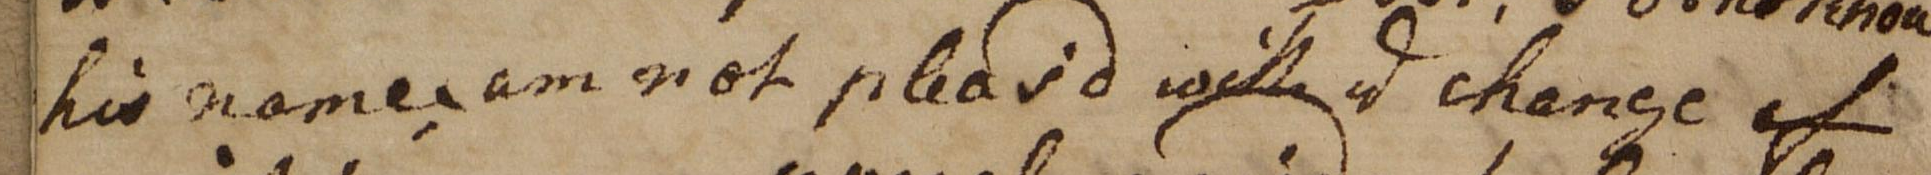his name- am not pleas'd with y^e change of
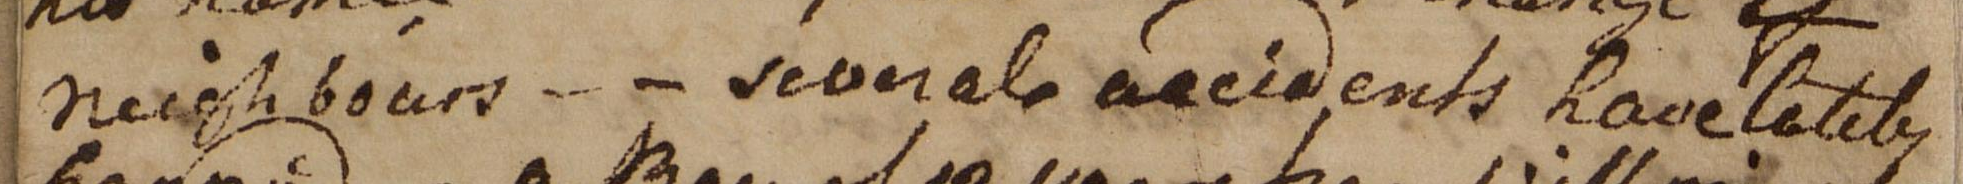neighbours-- several accidents have lately
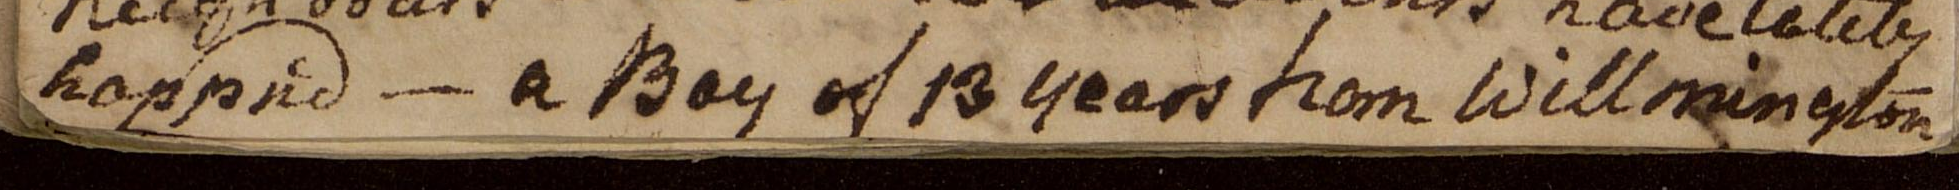happn'd- a Boy of 13 years from Willmington
